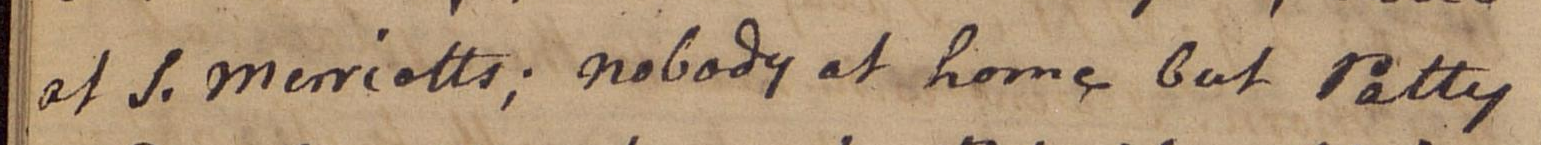at S. Merriotts; nobody at home but Patty
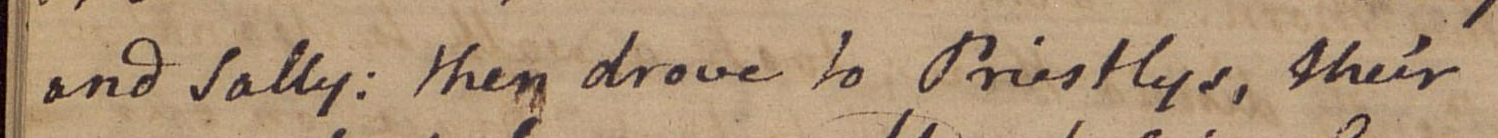and Sally; then drove to Priestlys, their
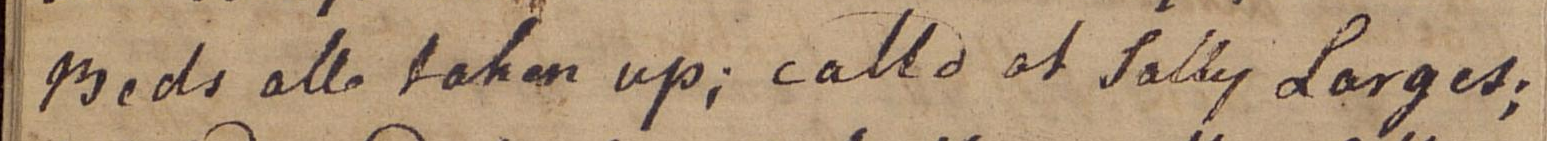Beds all taken up; calld at Sally Larges;
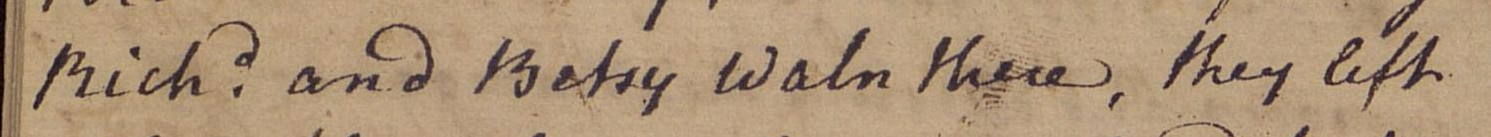Rich^d. and Betsy Waln there, they left
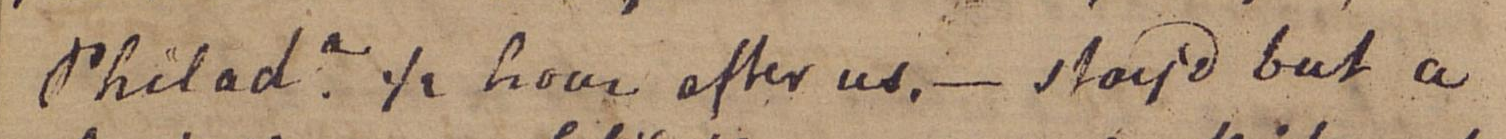Philad^a. 1/2 hour after us,- stay'd but a
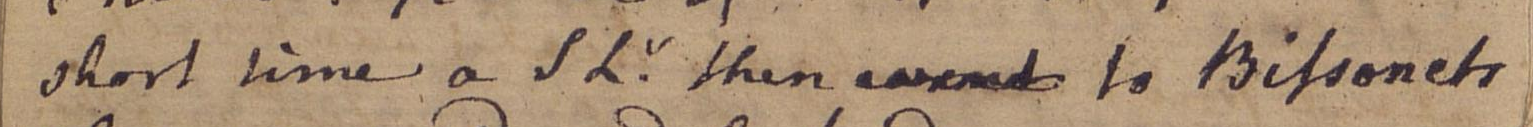short time a SL^s. then [went] to Bissonets
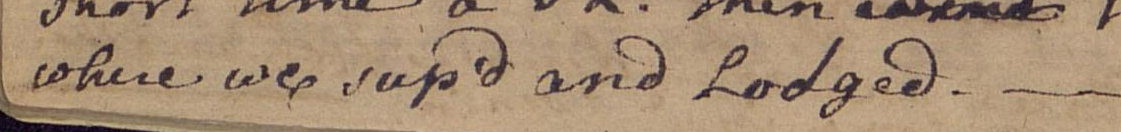where we sup'd andLodged-
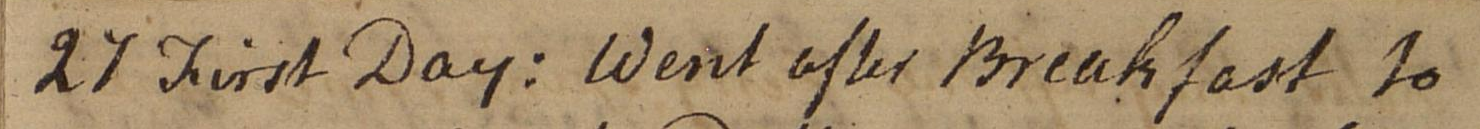27 First Day: Went after Breakfast to
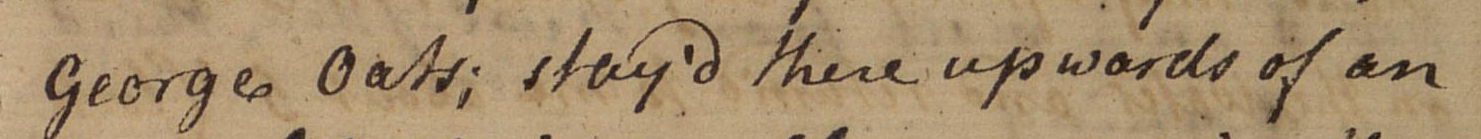George Oats; stay'd there upwards of an
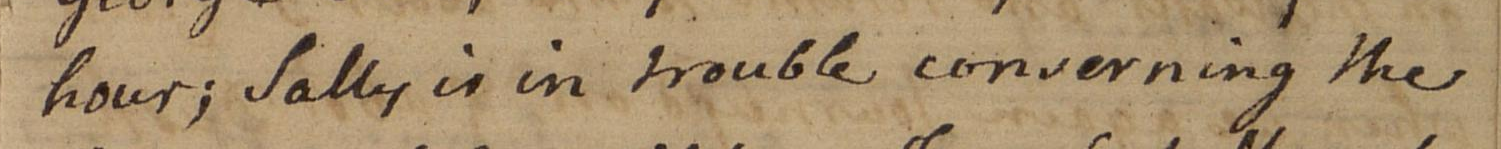hour; Sally is in trouble conserning the
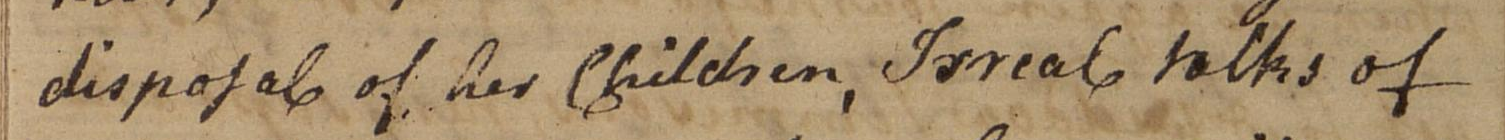disposal of her Children, Isreal talks of
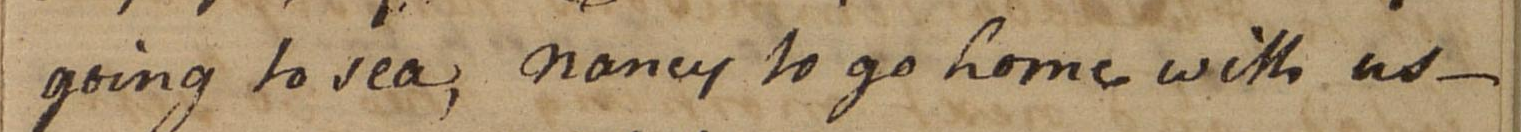going to sea, Nancy to go home with us-
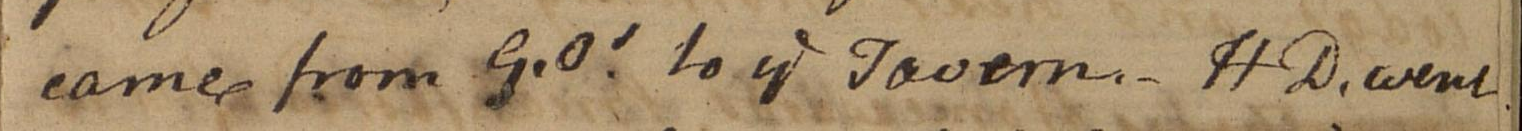came from G.O^s. to y^e Tavern.- HD. went
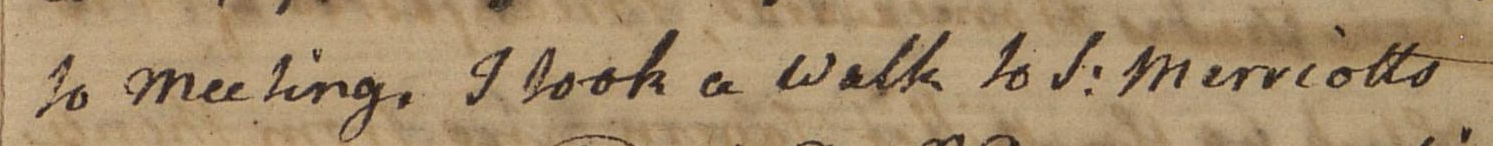to Meeting. I took a walk to S: Merriotts
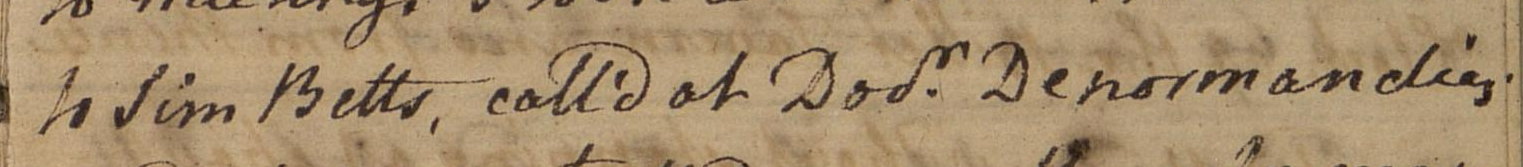to Sim Betts, call'd at Doc^r. Denormandis
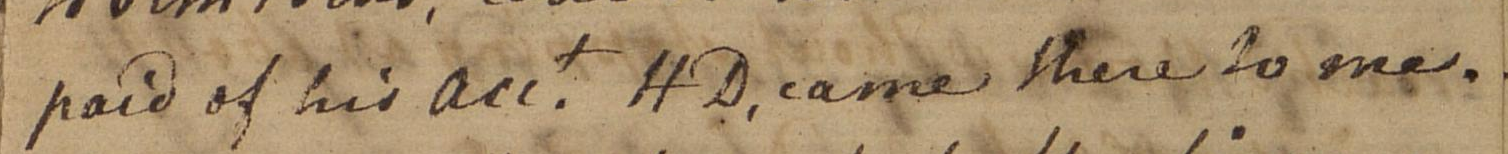paid of his acc^t. HD came there to me.
